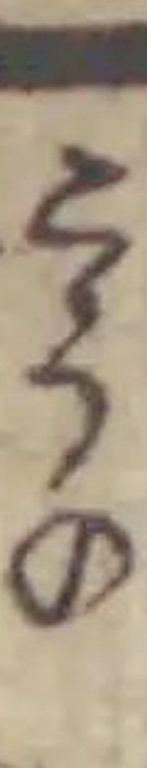とうの
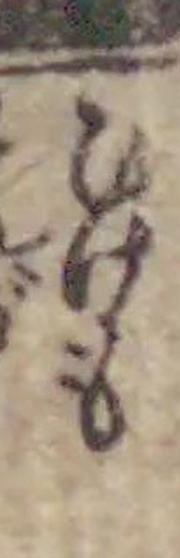ひけも
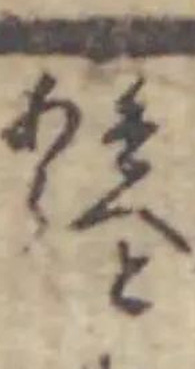兵へと
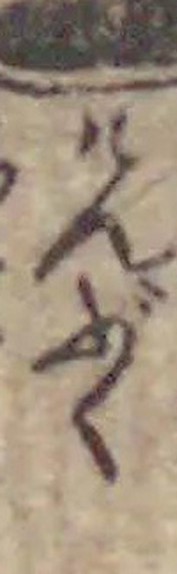けんぶく
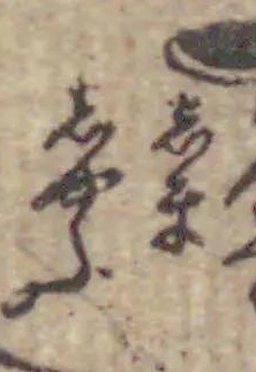しやふ
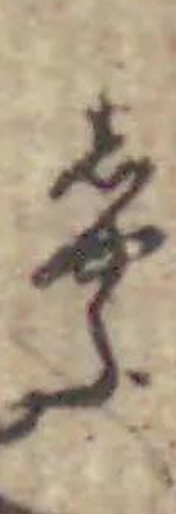しやふ
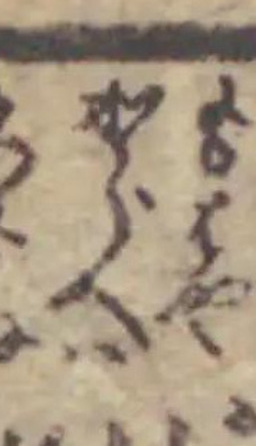からへは
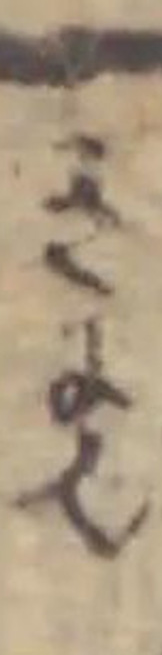きに也
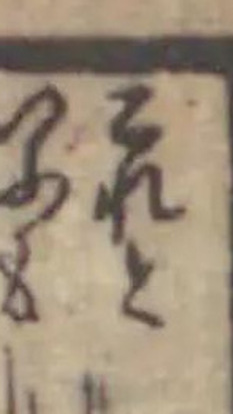いふも
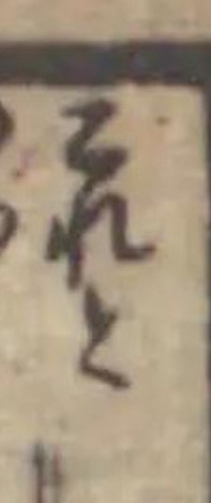これと
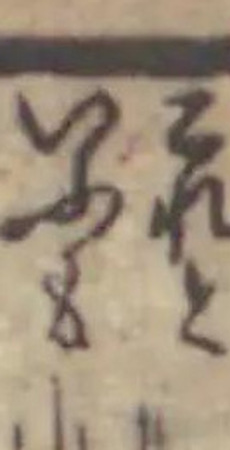いふも
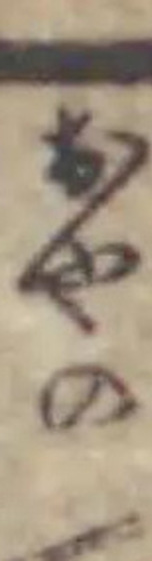おやの
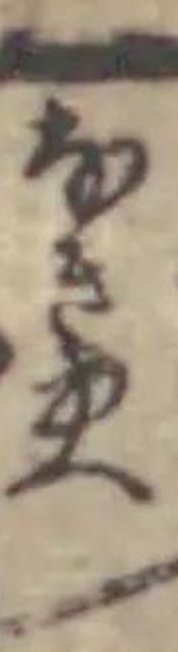なきゆへ
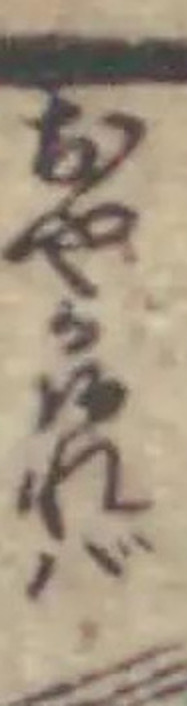おやかあれば
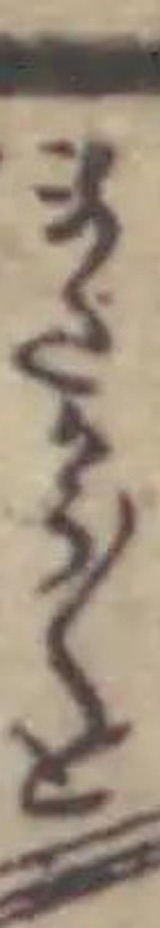またかう〳〵を
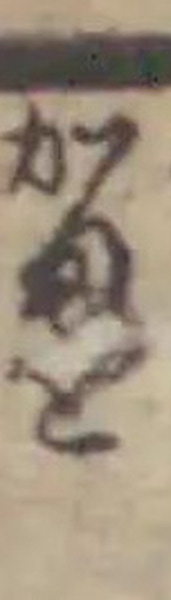かまを
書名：間違月夜鍋 2巻
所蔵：国立国会図書館 National Diet Library, JAPAN
